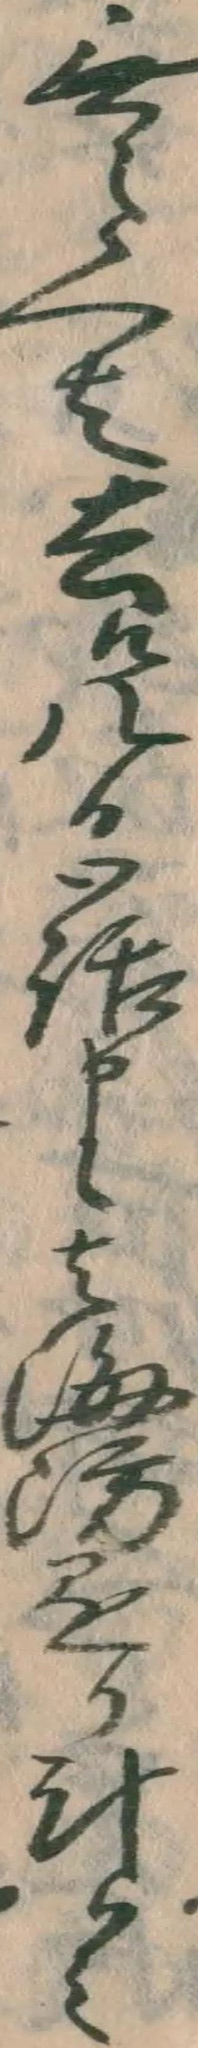無之候へ者去ル八日御話申候者海防懸り計りに
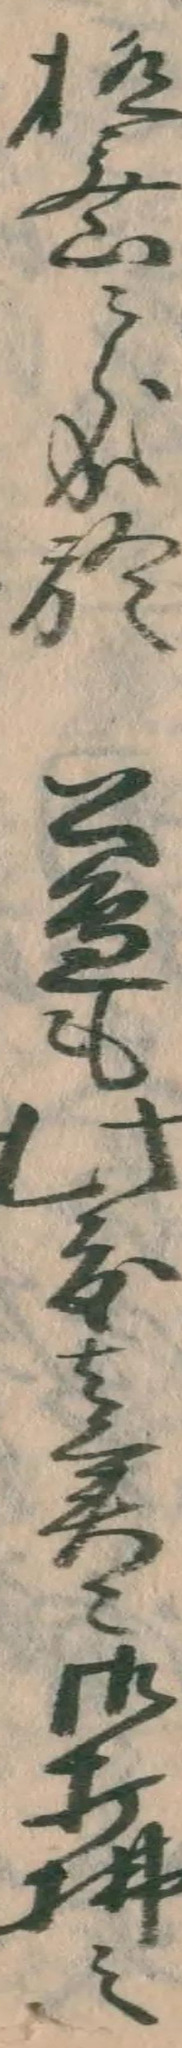極密ニ被成於公邊も此度者実ニ御打拂之
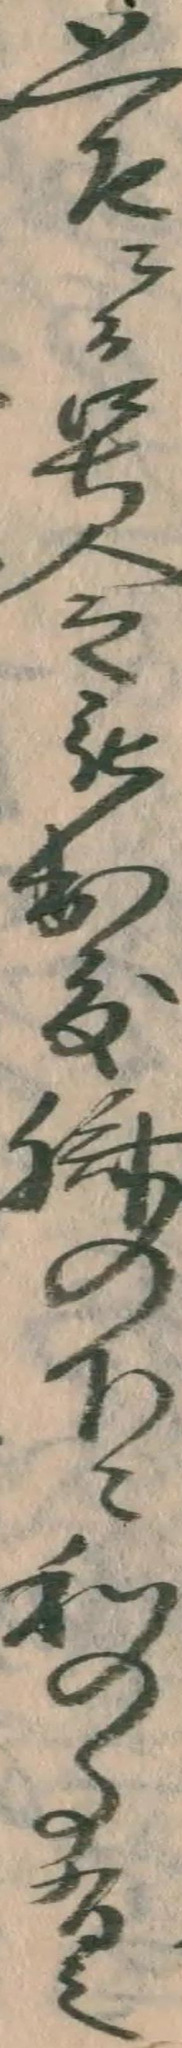思召ニ而号令被出度臍の下ニ和の事有之
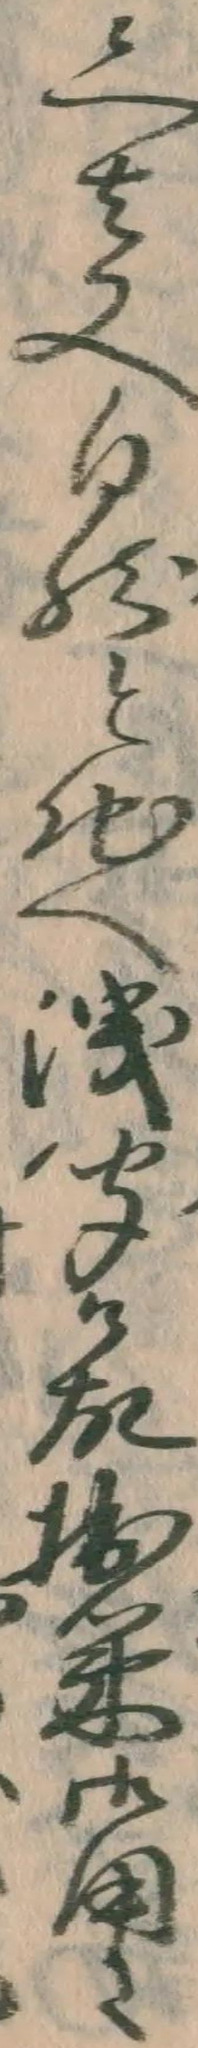候へ者自然と他へ洩聞候故拙策御用に
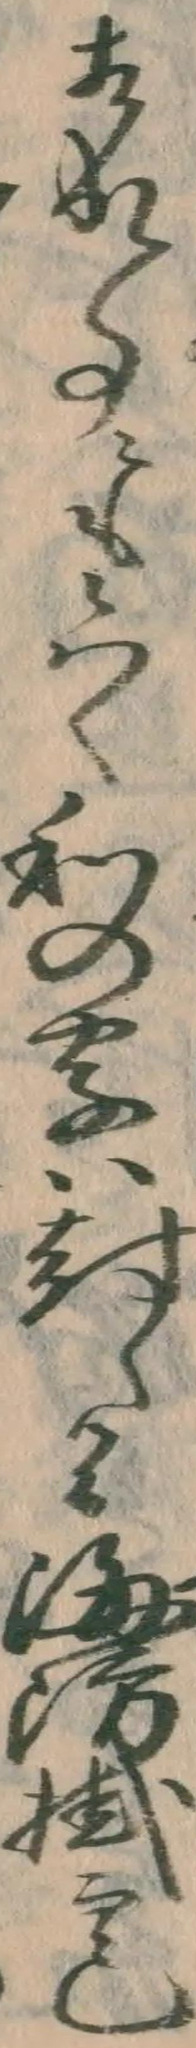相成候事二も候はヽ和の字ハ封し候而海防掛而已
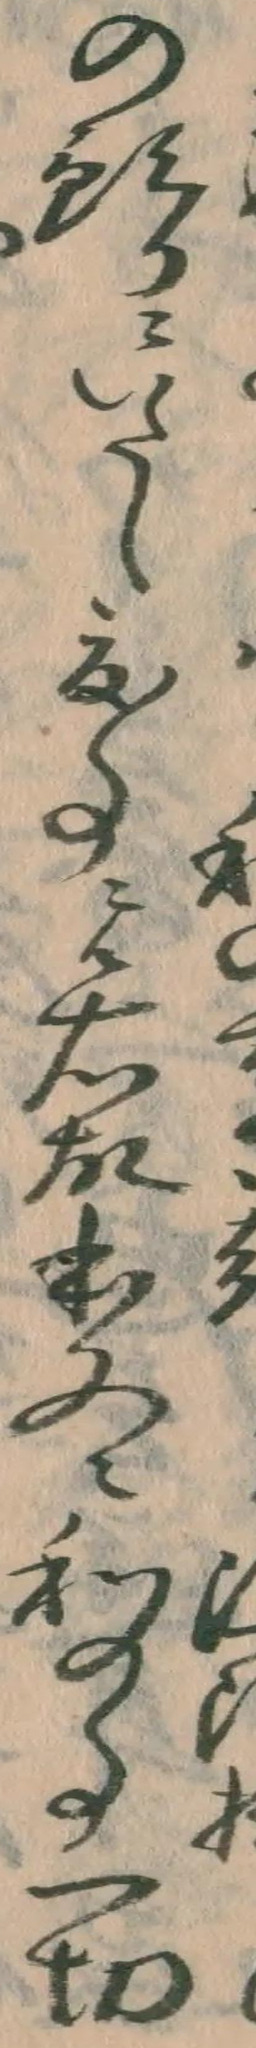の預りニいたし度事ニ候右故本文ニ和の事一切
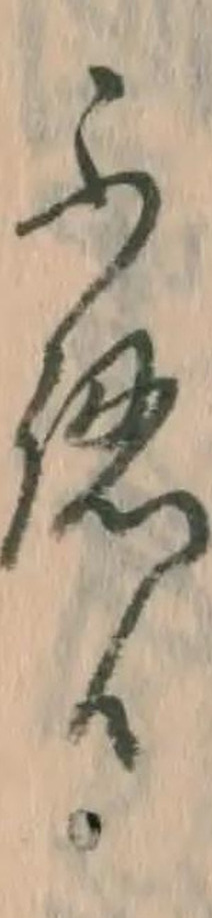不認候
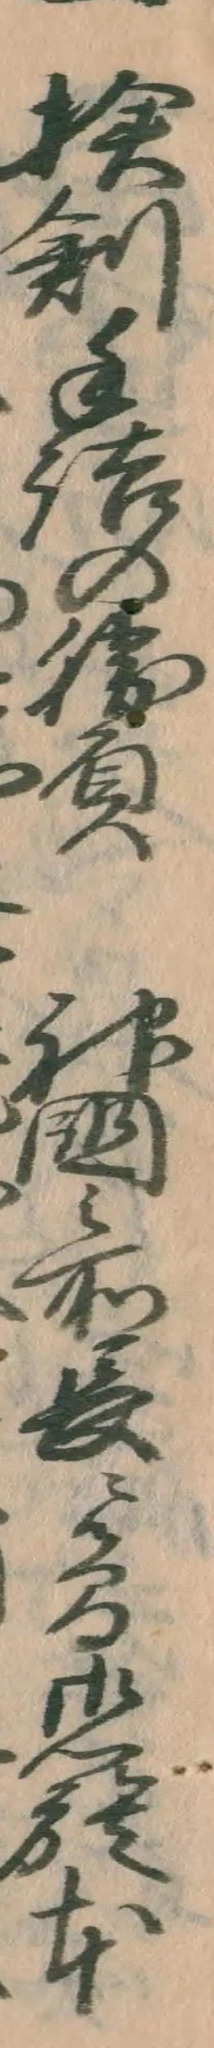一槍剣手詰の勝負神国之所長ニ候間御籏本
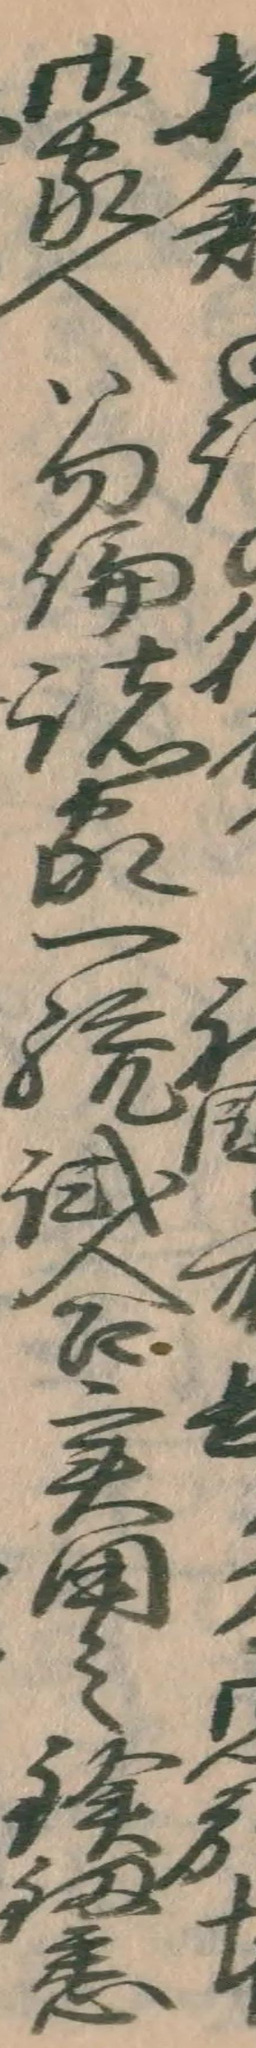御家人ハ勿論諸家一統試合実用之鎗剱悉
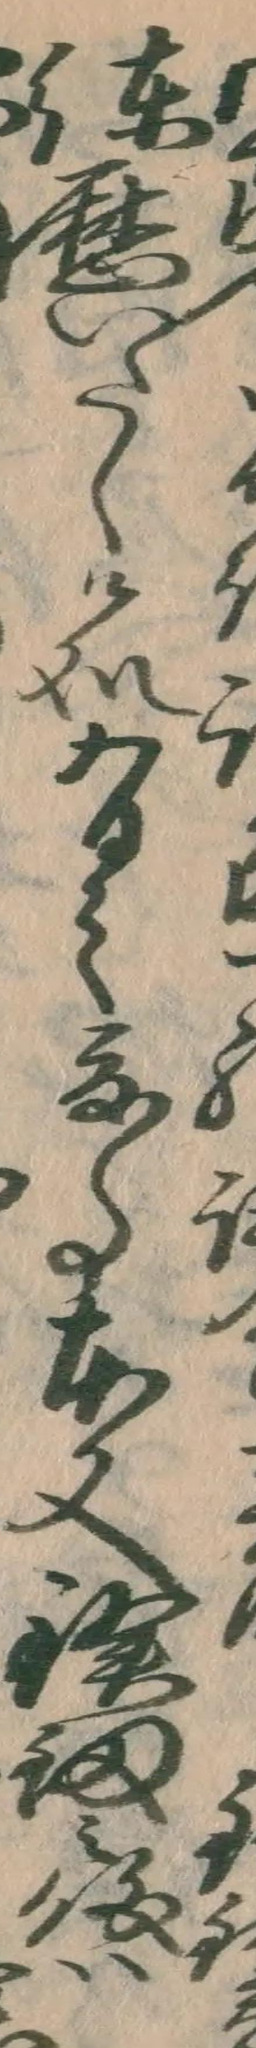練歴いたし候処有之度事本文鎗剱之儀ハ
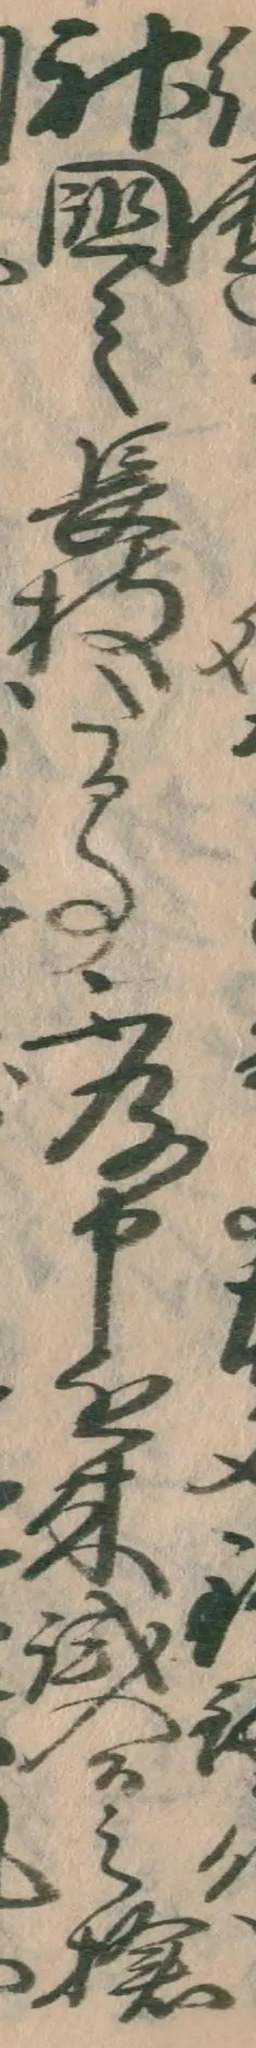神国之長技たる事不及申近来試合之槍
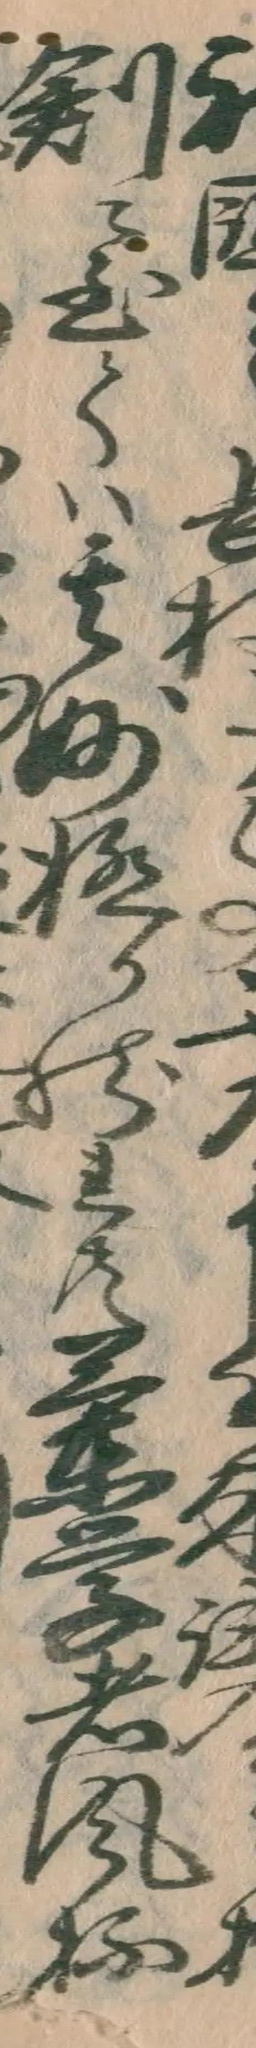剣ニ至てハ其妙極り然れ共蘭学者風抔
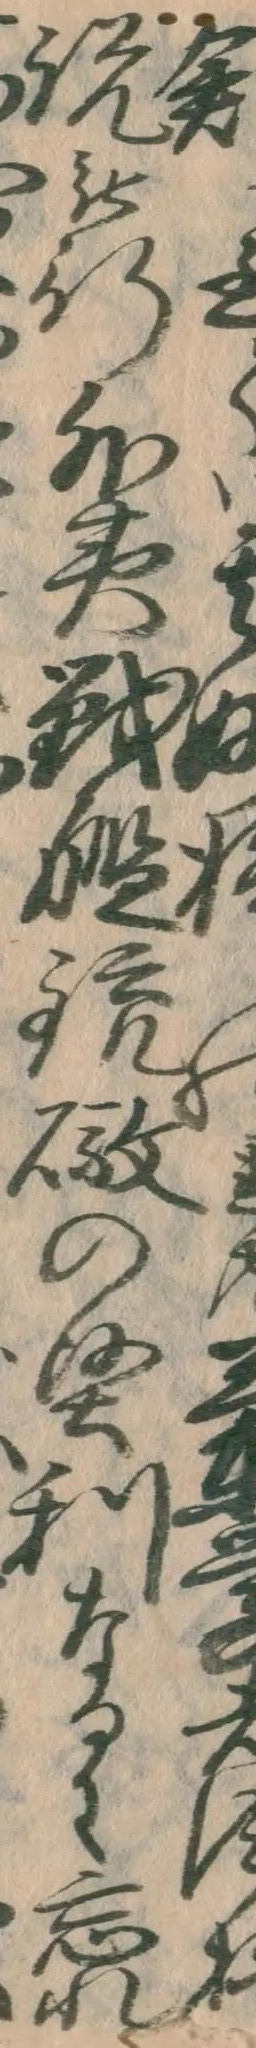説被行外夷戦艦銃礮の堅利なるに忘れ
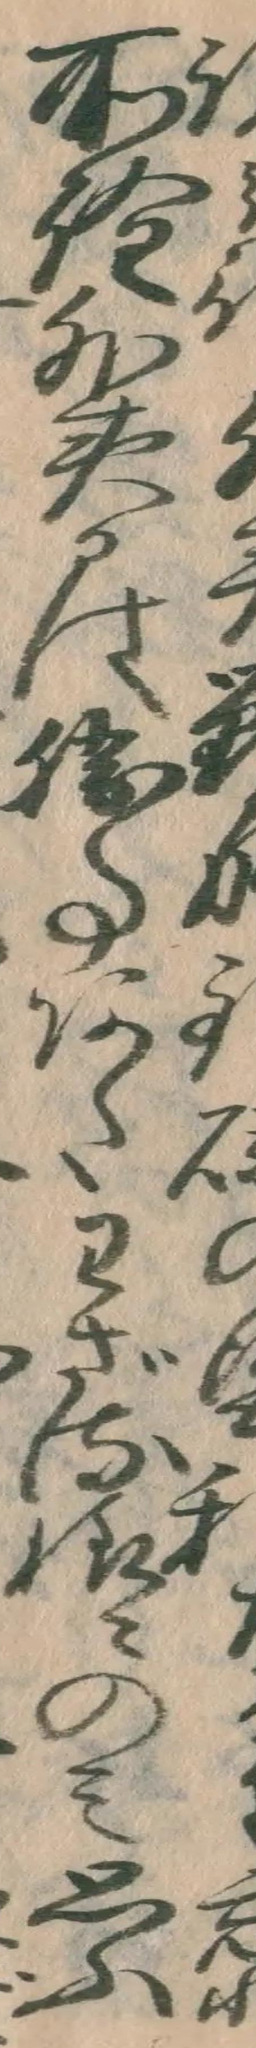所詮外夷には勝事あたわざる様ニのミ思ふ
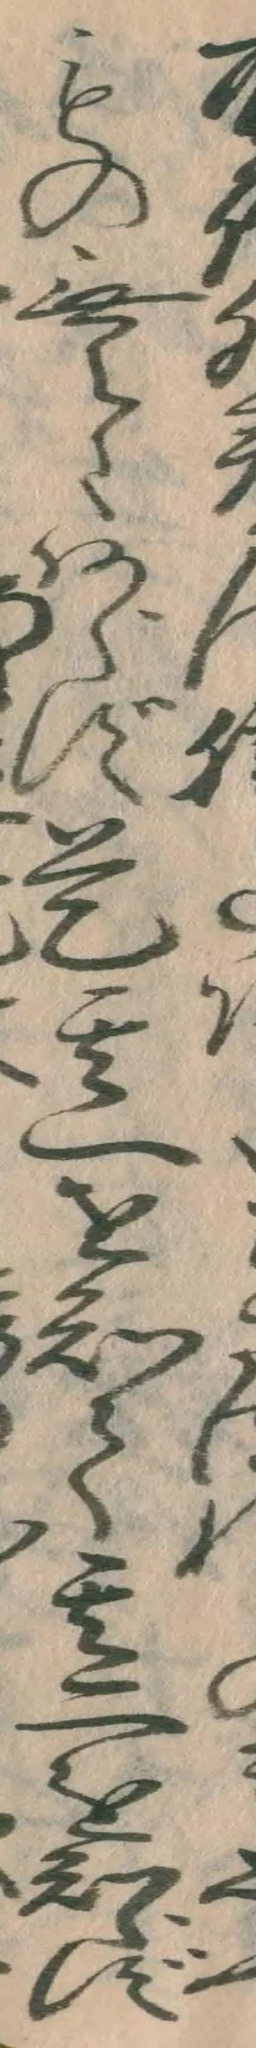もの無之にあらず是其一を知て其二を知らず
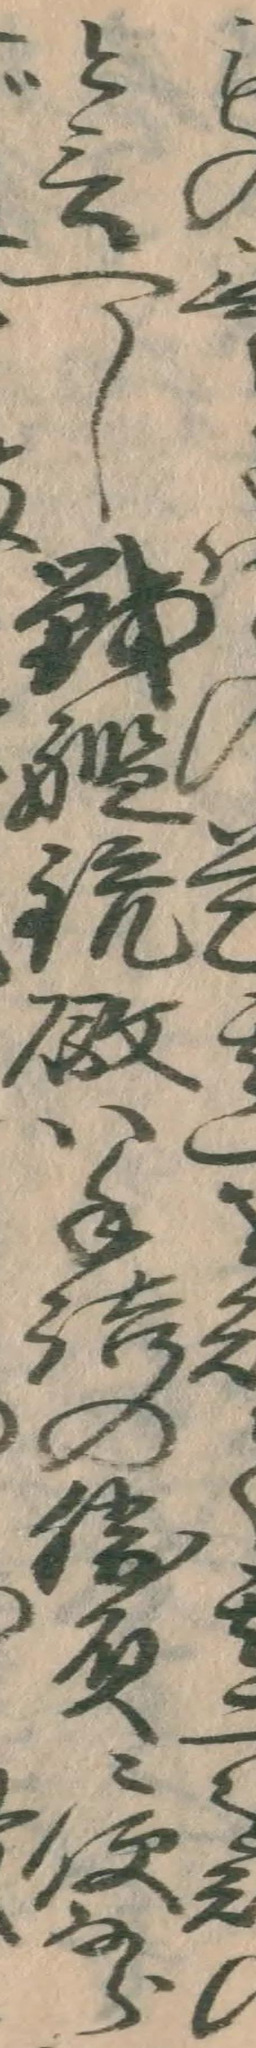と云へし戦艦銃礮ハ手詰の勝負ニ便なら
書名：麗斎叢書. 20
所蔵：国立国会図書館 National Diet Library, JAPAN
